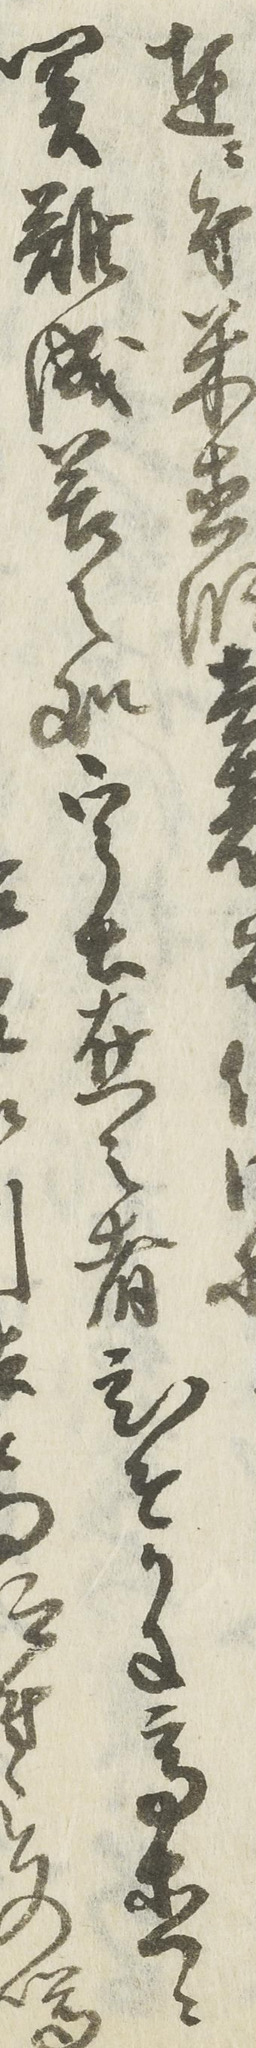買難成筈之処宇土在之者ひとりに高直ニ
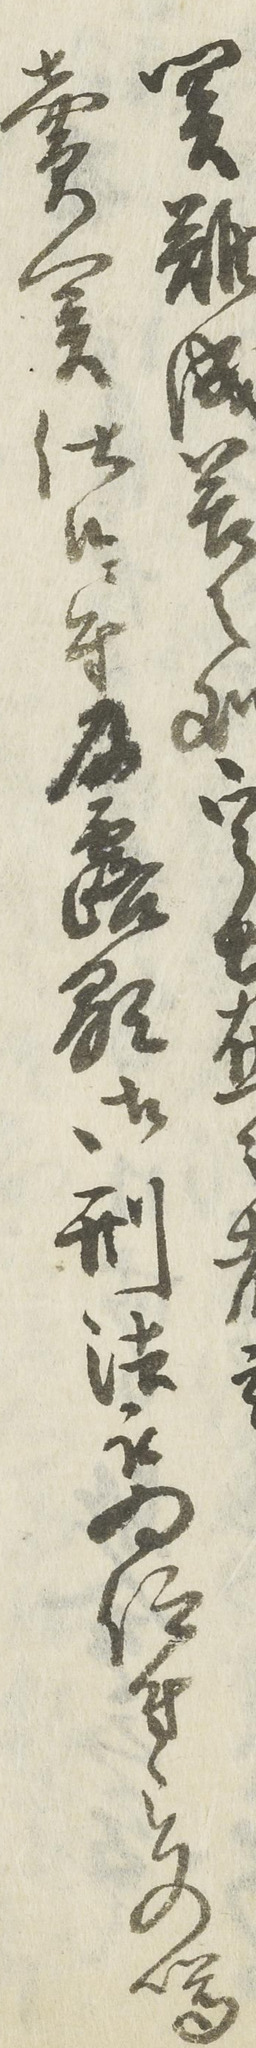売買仕候ニ付及露顕御刑法被仰付候との噂
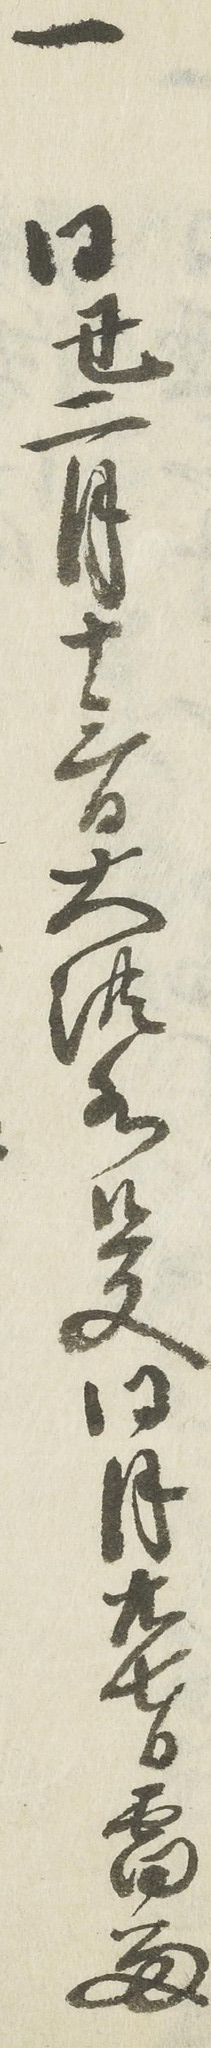一同丑二月十三日大洪水且又同月廿七日雷雨
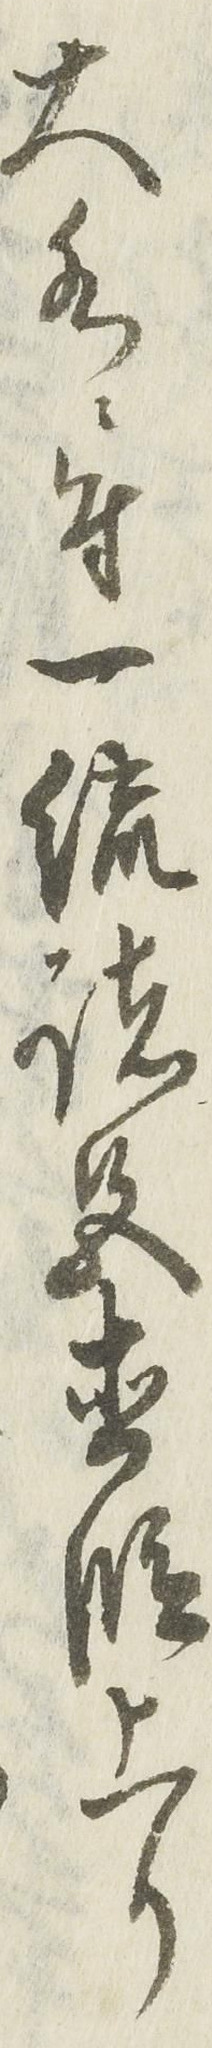大水ニ付一統諸色直段上り
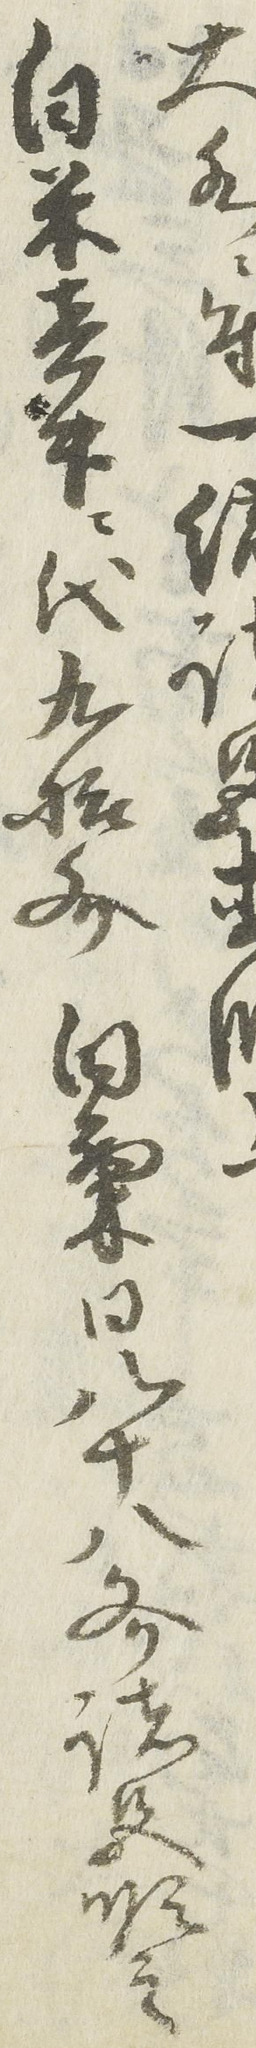白米壱斗ニ代九拾文白粟同八十八文諸色順之
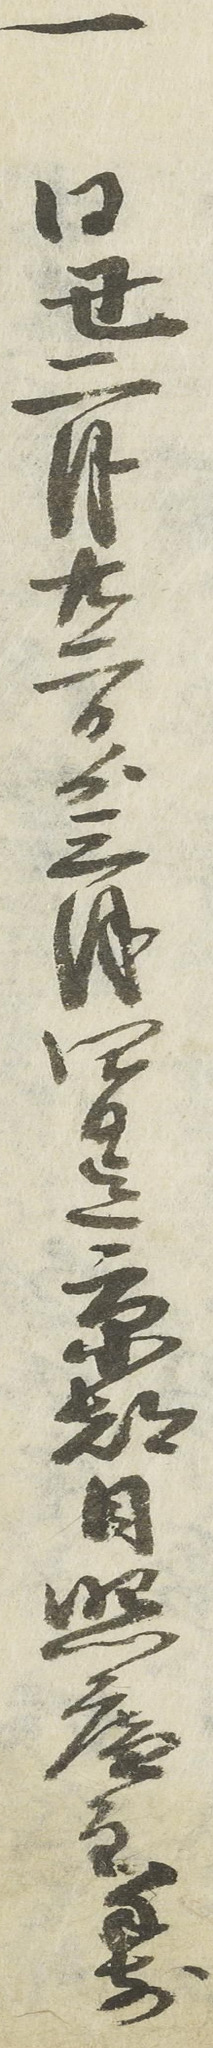一同丑二月廿二日ゟ三月四日迄京都日照庵主手前

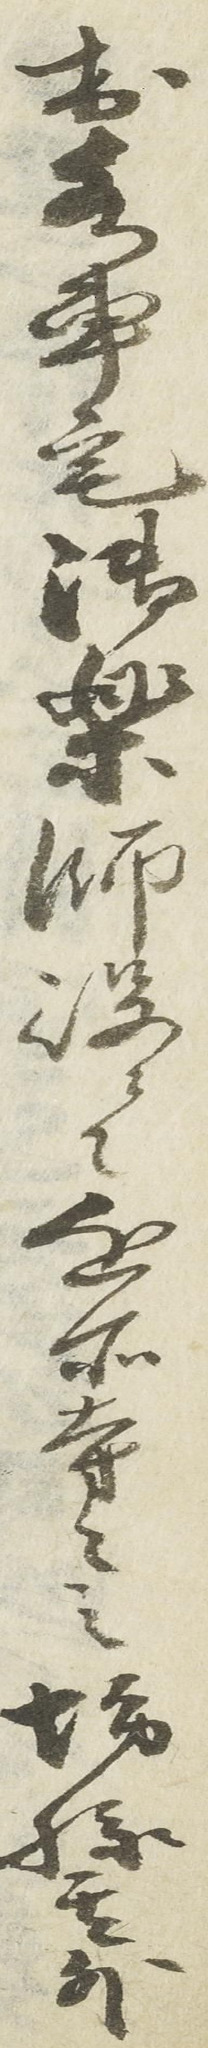於水車宅御楽師役ニて近所寺々之御坊様其外
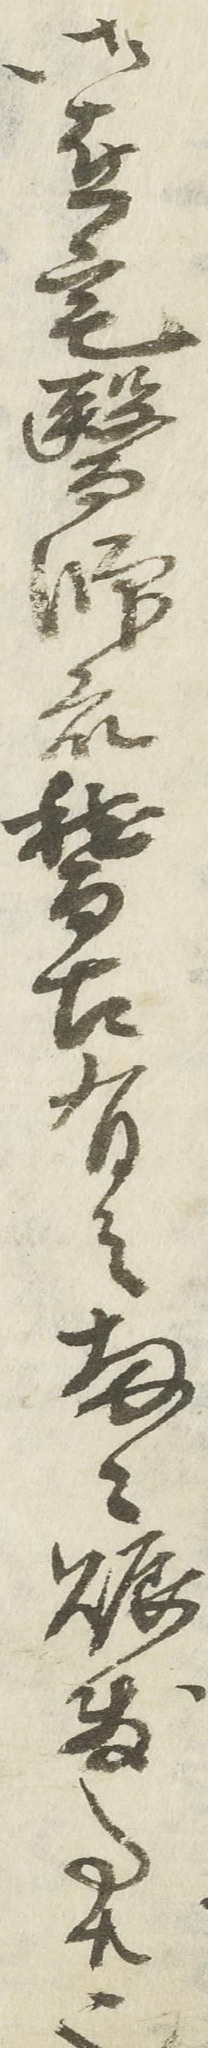御在宅医師衆稽古有之扨々賑敷事共也
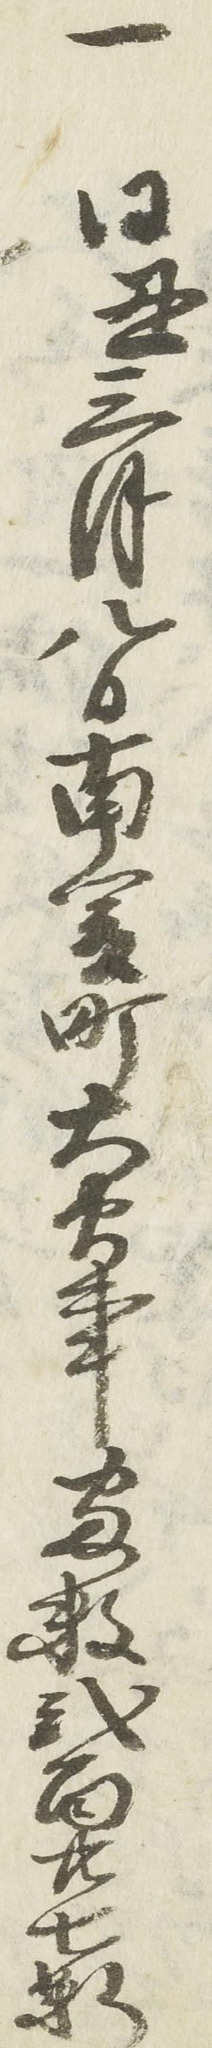一同丑三月八日南関町大火事家数弐百廿七軒
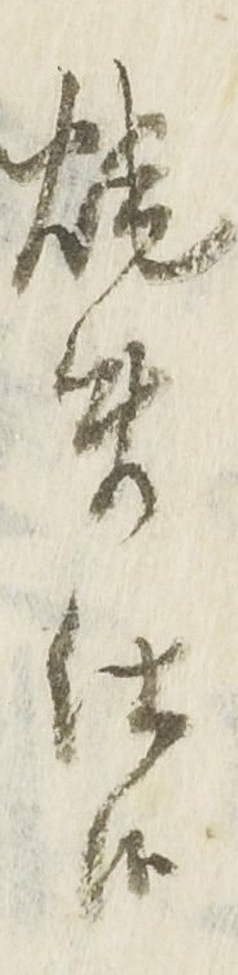焼失仕候
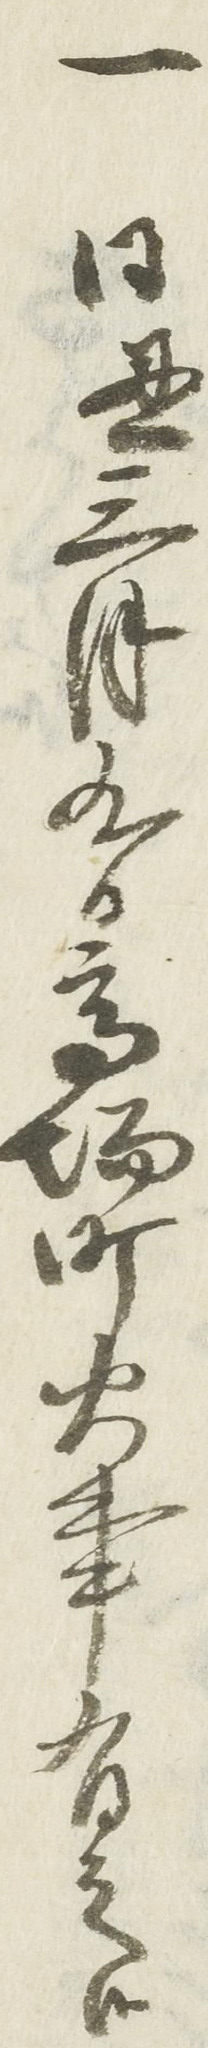一同丑三月九日高場所火事有之候
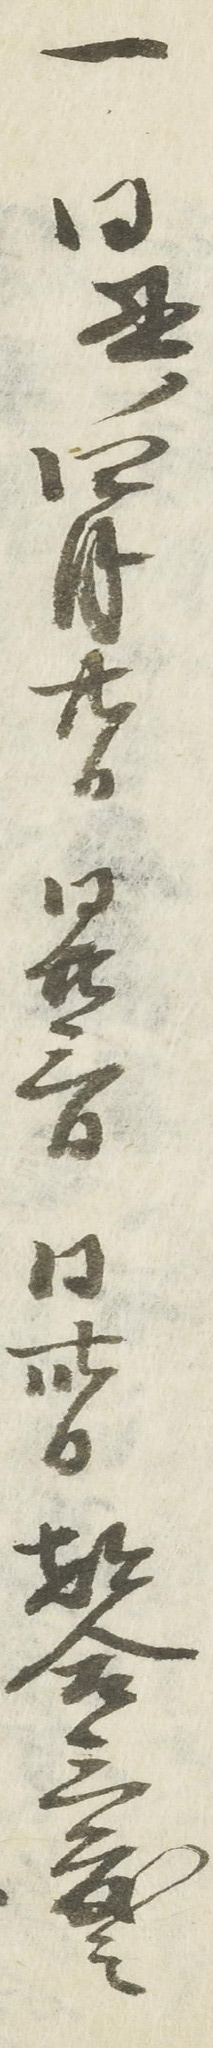一同丑ノ四月廿日同廿三日同卅日都合三度の
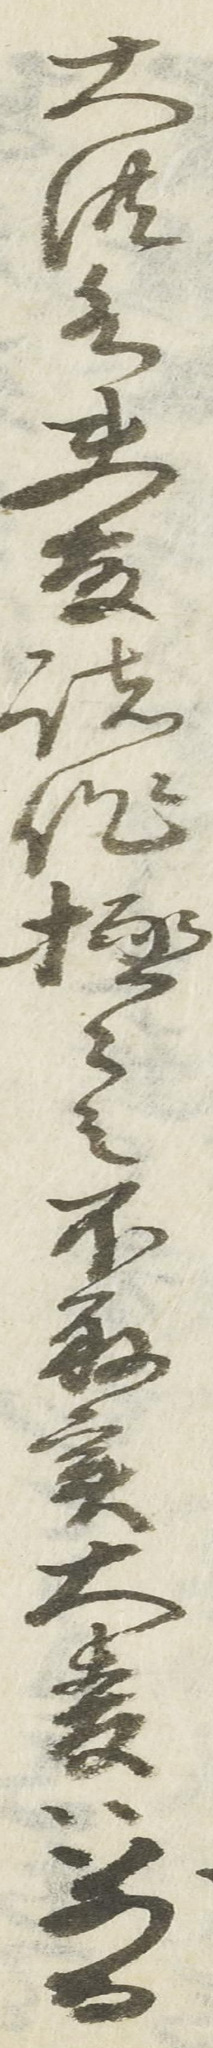大洪水夫故諸作極々之御不取実大麦は別而
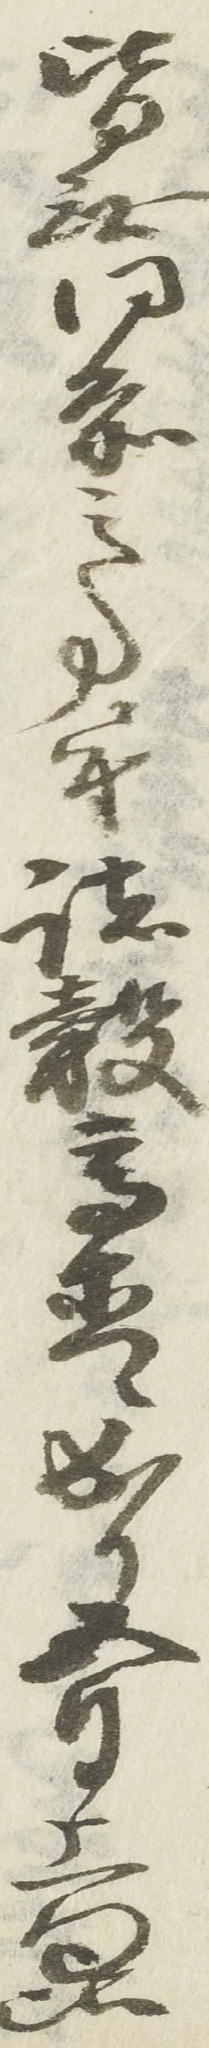皆無同前之事ニ付諸穀高直候成り五月上旬比
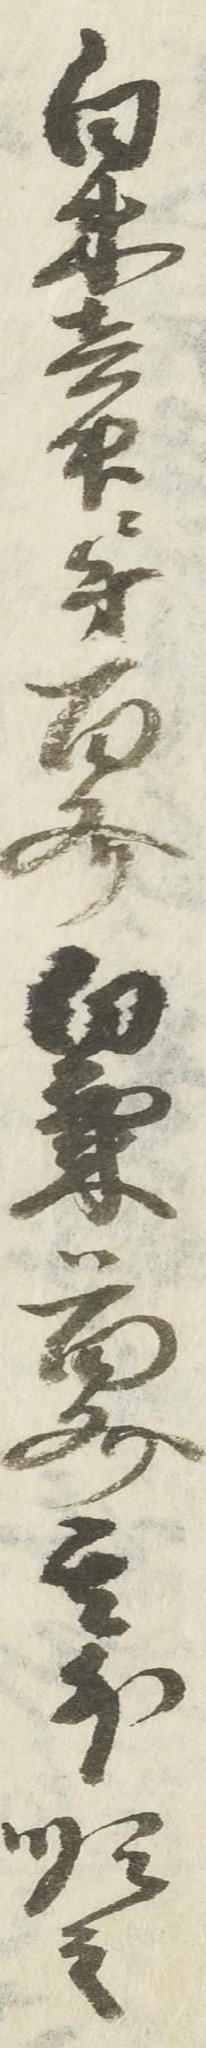白米壱升ニ付百文白粟は百文其外順之
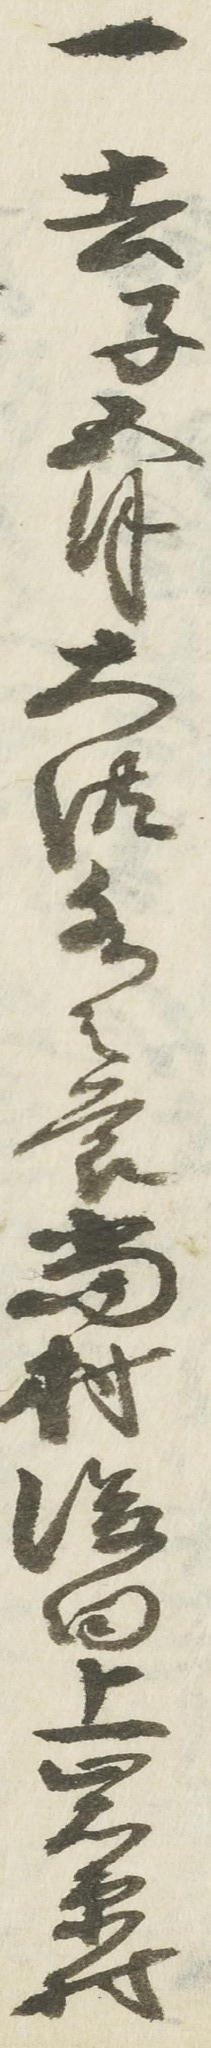一去子五月大洪水之節当村後日上岩原村
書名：後見笑
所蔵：東京大学地震研究所図書室 Earthquake Research Institute Library, The University of Tokyo, JAPAN
